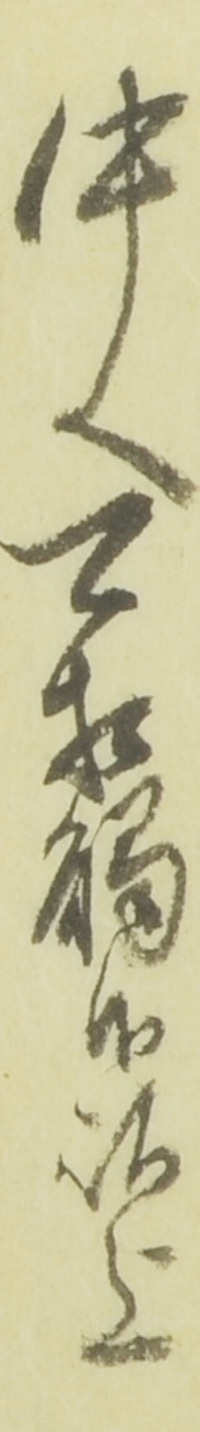中へ可相触候以上
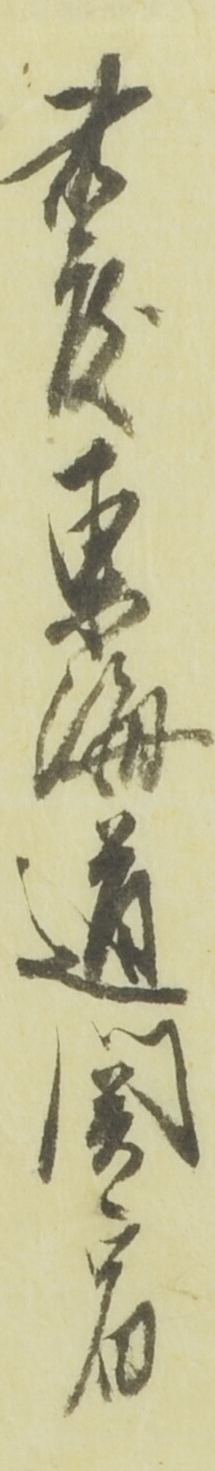此度東海道関宿
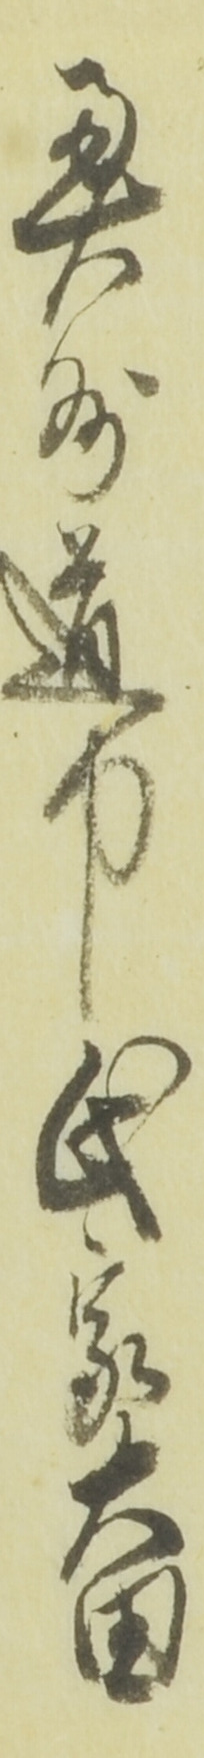奥州道中氏家大田
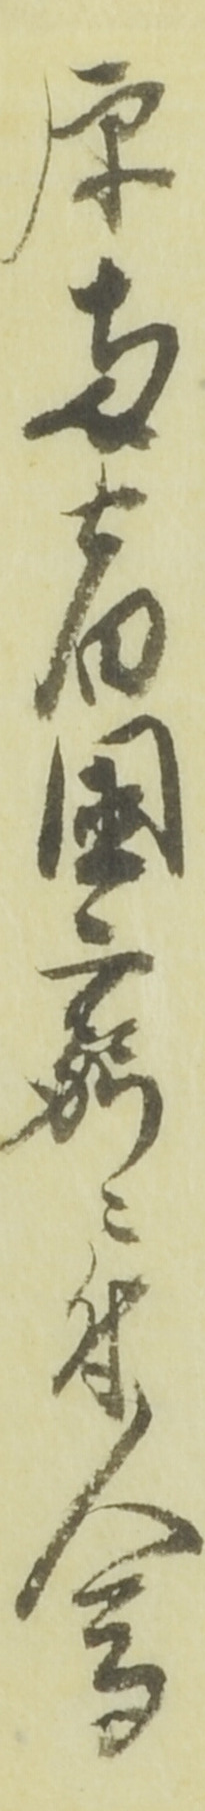原両宿困窮ニ付人馬
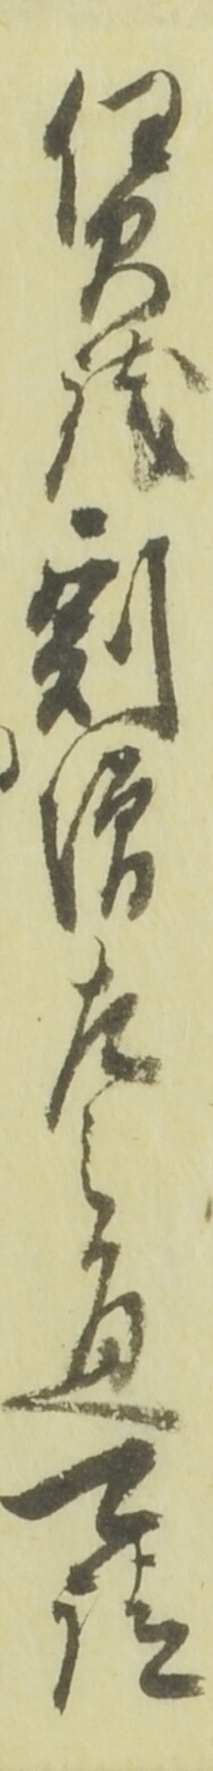賃銭割増左之通可請
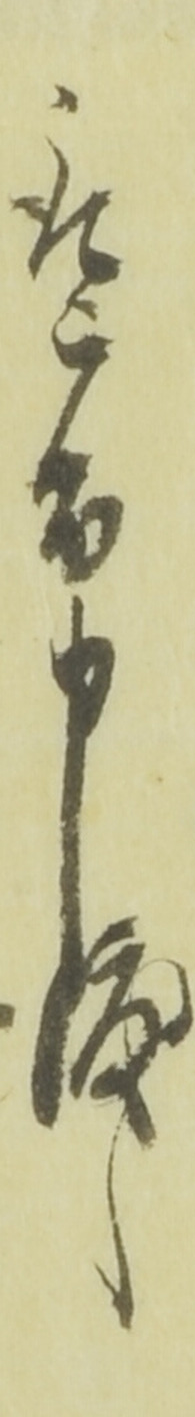取被旨申渡候
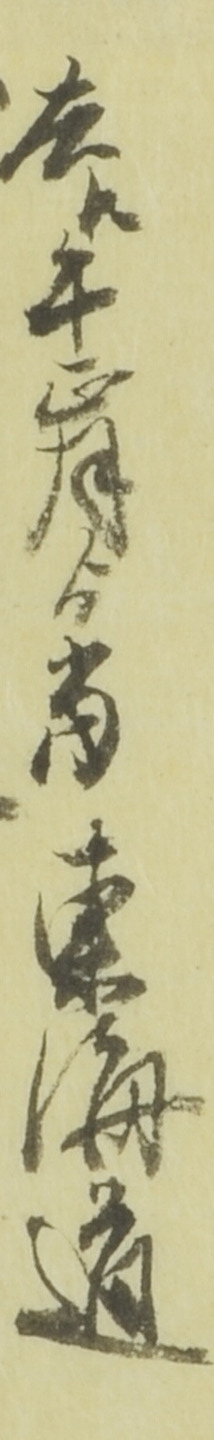去ル午正月ゟ当東海道
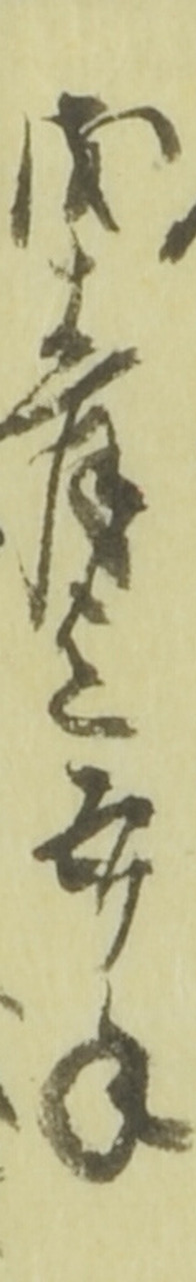戌十二月迄五ヶ年
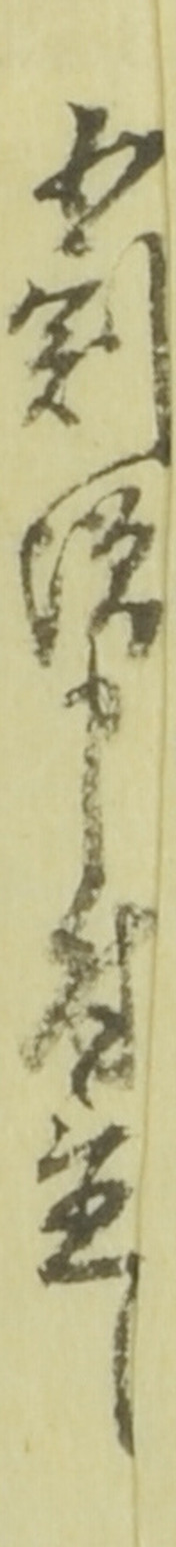五割増申付置候
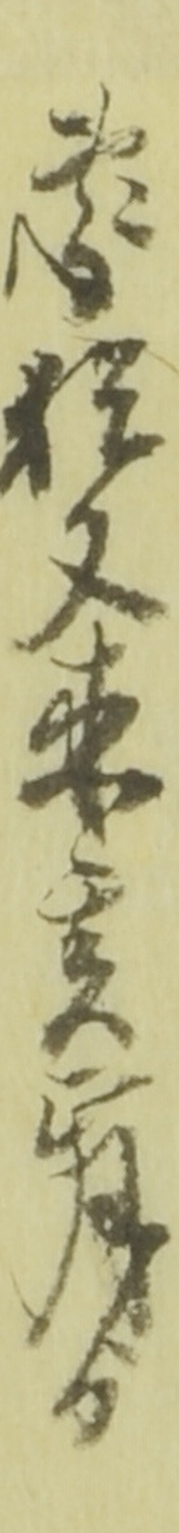処猶又来亥正月ゟ
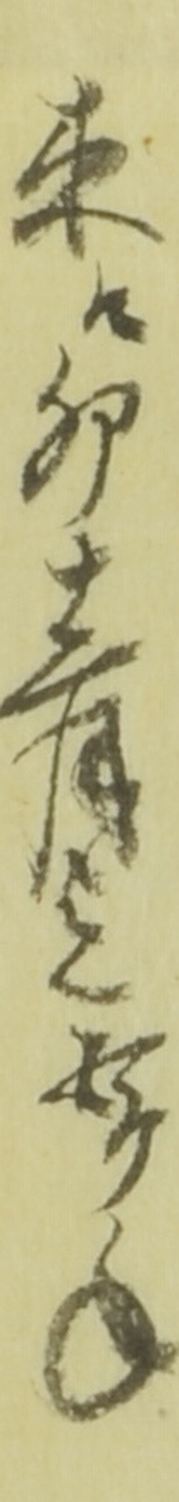来ル卯十二月迄五ヶ年
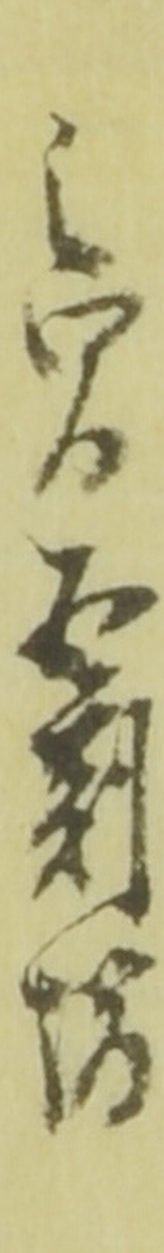之間五割増
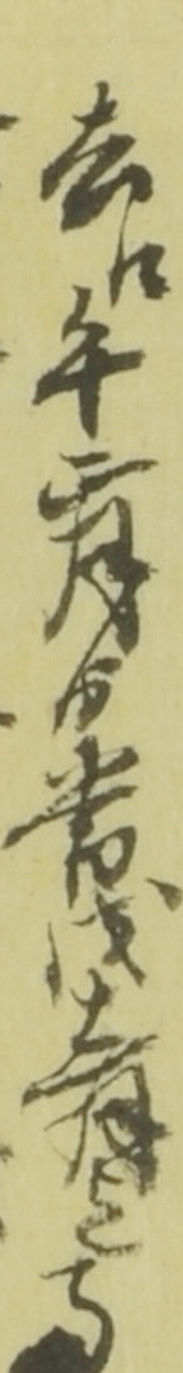去ル午正月ゟ当戌十二月迄
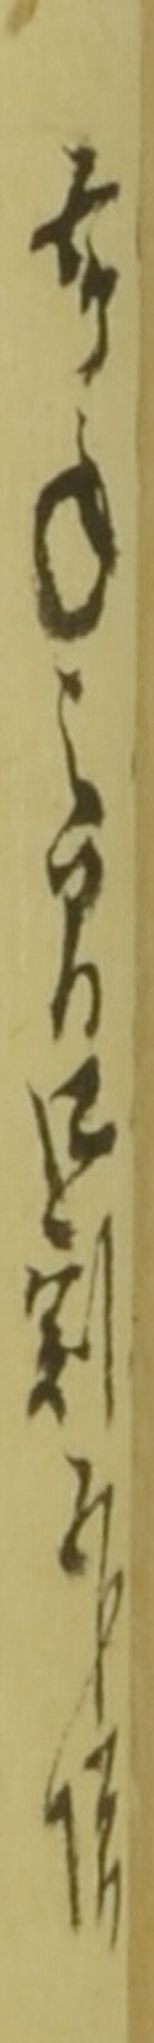五ヶ年之間四割五分増
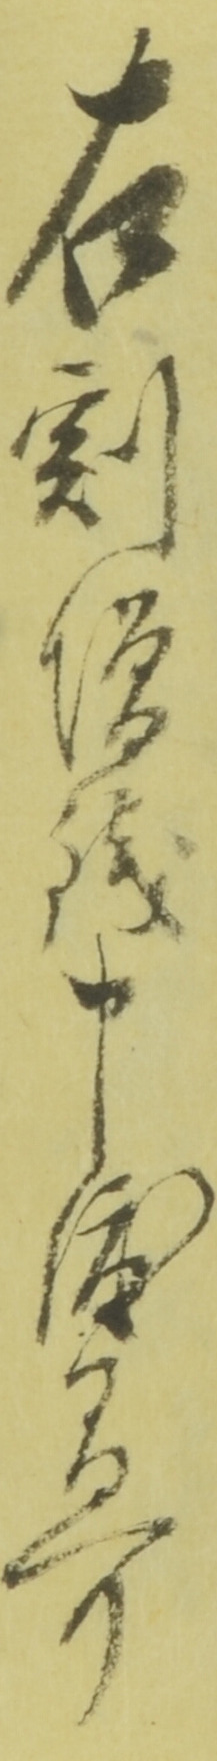右割増銭申渡間可
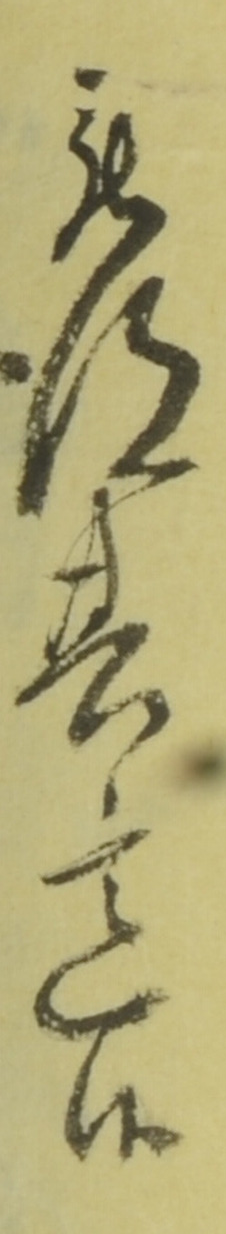被得其意候
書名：御触書御書附控
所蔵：伊那市立高遠町図書館・合同会社AMANE
